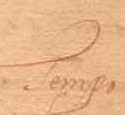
Tempo
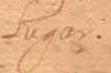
Lugar.
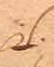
.L.
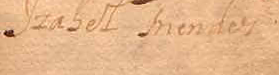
Izabel mendes
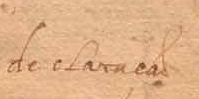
declaraçaõ
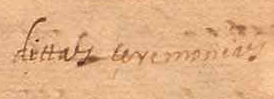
dittas çeremonias
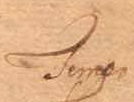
Tempo
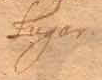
Lugar.
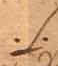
.L.
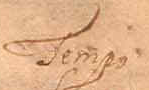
Tempo
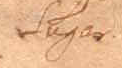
Lugar.
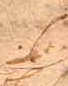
.L.
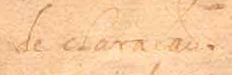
declaraçaõ.
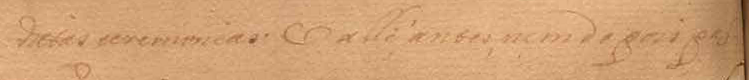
ditas ceremonias. E alli antes, nem depois pas
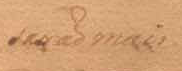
saraõ mais
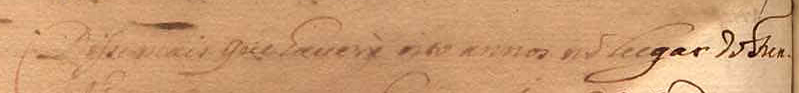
Disse mais que hauerà oito annos no lugar do Fun
